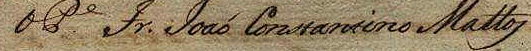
O P.e Fr. Joaõ Constantino Mattos
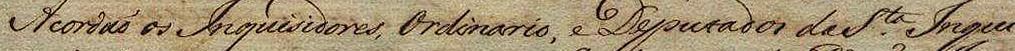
Acordaõ os Inquisidores, Ordinario, e Deputados da S.ta Inqui
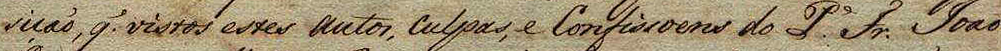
siçaõ, q̄ vistos este autos, culpas, e Confissoens do P.e Fr. Joaõ
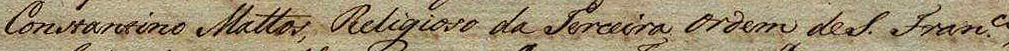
Constantino Mattos, Religioso da Terceira Ordem de S. Fran.co,
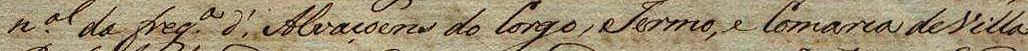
n.al da freg.a d'Alvaçoens do Corgo, Termo, e Comarca de Villa
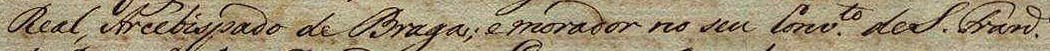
Real, Arcebispado de Braga; e morador no seu Conv.to de S. Fran.co
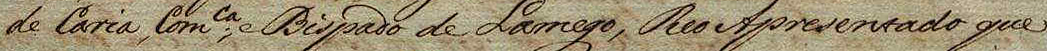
de Caria, Com.ca, e Bispado de Lamego, Reo Apresentado que
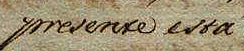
presente está.
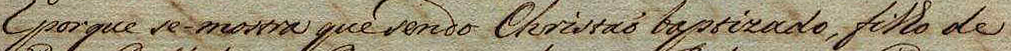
E porque se-mostra que sendo Christaõ baptizado, filho de
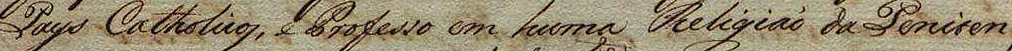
Pays Catholicos, e Professo em huma Religiaõ de Peniten
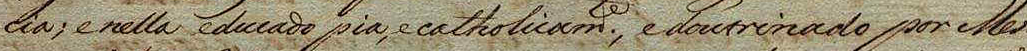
cia; e nella educado pia, e catholicam.te, e doutrinado por Mes
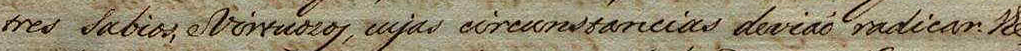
tres sabios, e virtuozos, cujas circunstancias deviaõ radicar-lhe,
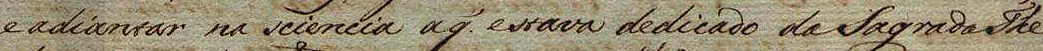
e adiantar na sciencia a q̄ estava dedicado da Sagrada The
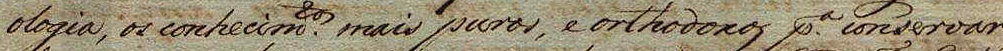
ologia os conhecim.tos mais puros, e orthodoxos p.a conservar
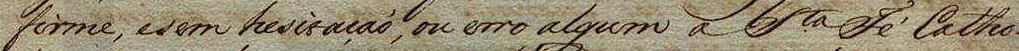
firme, e sem hesitaçaõ, ou erro algum a S.ta Fé Catho
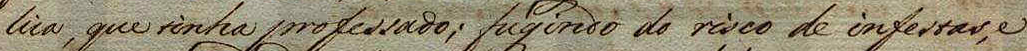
lica, que tinha professado; fugindo do risco de infestas, e
